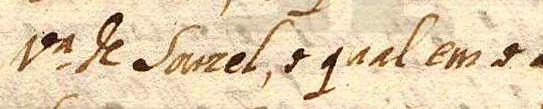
Va. de Souzel, o qual em o
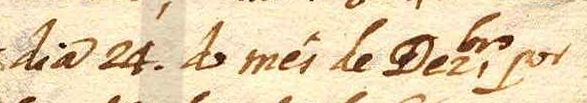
dia 24. do mês de Dezbro, por
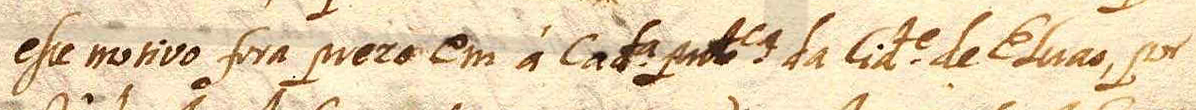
esse motivo fora prezo em á Cad̄a. pub̄ca. da Cid̄.e de Eluas, por
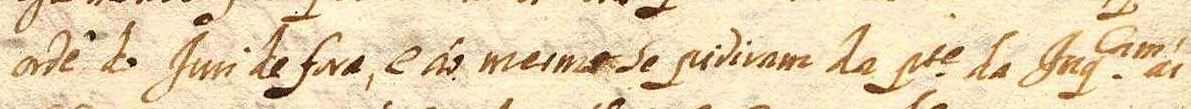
ordē do Juis de fora, e ao mesmo se pidiram da pt.e da Jnq.çam ás
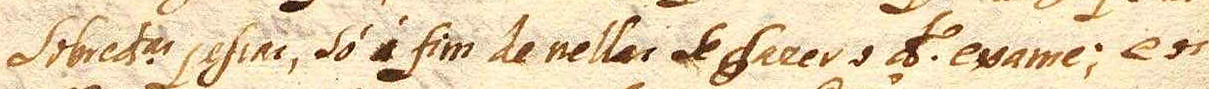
sobred̄.as pessas, só á fim de nellas se fazer o d̄.o. exame; e os
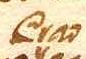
eraõ
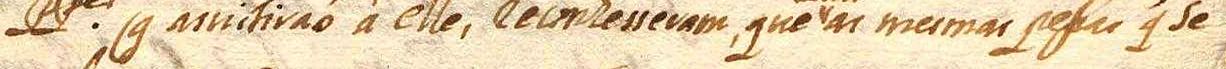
PP.es q̄ assistiraõ á elle, reconhesseram, que as mesmas pessas q̄ se
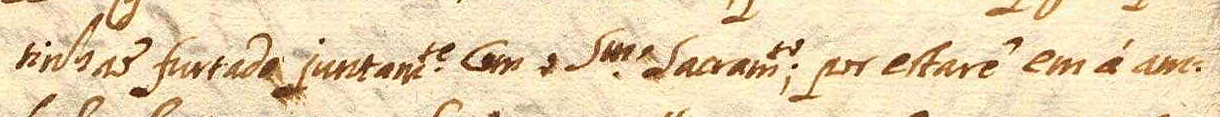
tinhaõ furtado juntam.te com o S.mo Sacramto; por estarē em á am
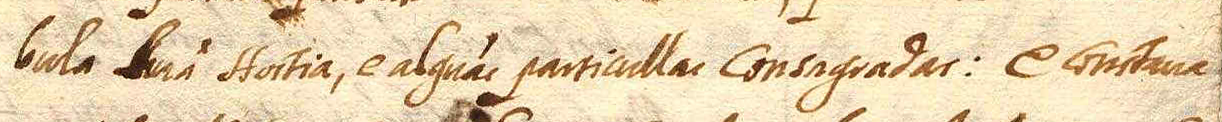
bula huā Hostia, e alguās particullas Consagradas: e constaua
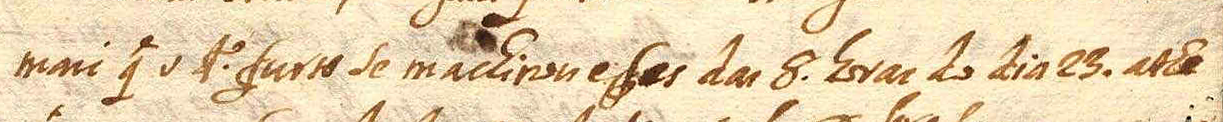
mais q̄ o d̄.o furto se machinou e foi das 8. horas do dia 23. athe
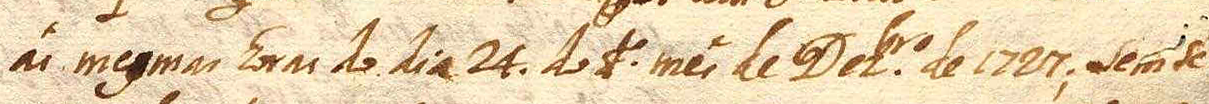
as mesmas horas do dia 24. do d̄.o mês de Dez.bro de 1727; sem se
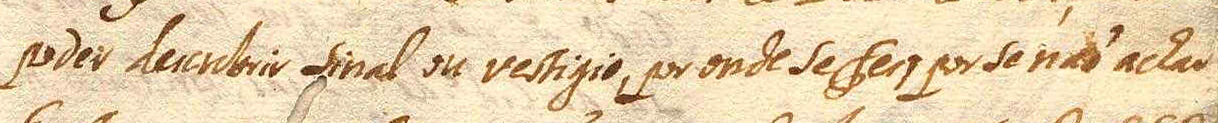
poder descubrir sinal ou vestigio, por onde se fes / por se naõ achar
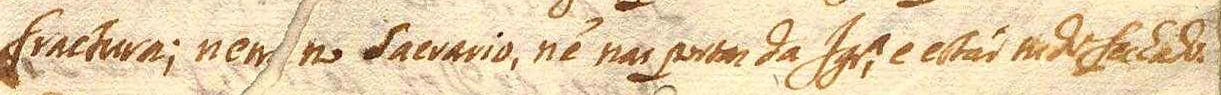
fractura; nem no sacrario, nē nas portas da Jgra, e estar tudo fachado.
